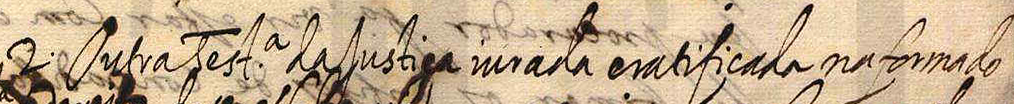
2. Outra Test.a da Justiça iurada e ratificada na forma do
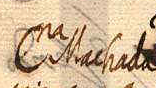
Cna Machada
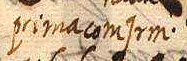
prima com Jrm.
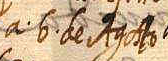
a .6. de Agosto
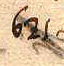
621
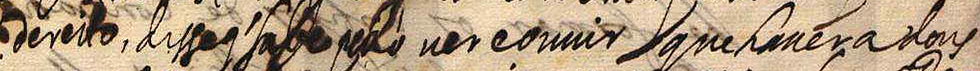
dereito, disse q̄ sabe per o uer e ouuir que hauera dous
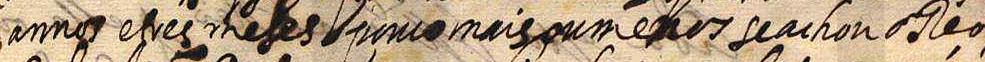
annos e tres meses pouco mais ou menos se achou o Reo
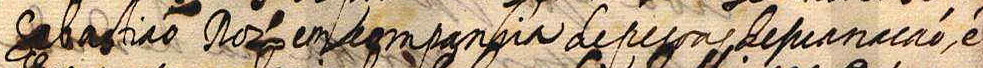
Sebastiaõ Roz̄ em companhia de pesoas de sua naçaõ, ē
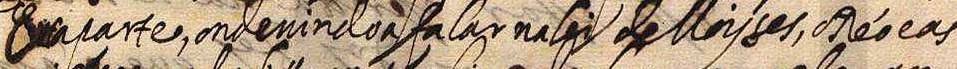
_ta parte, onde uindo a falar na lei de Moyses, o Reo e as
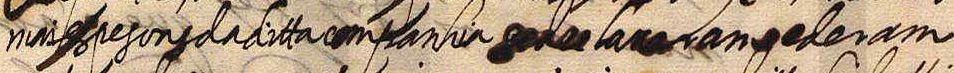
mais pesoas da ditta companhia se declararam e deram
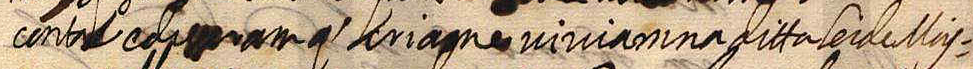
conta_ e disseram q̄ criam e uiuiam na ditta lei de Moy
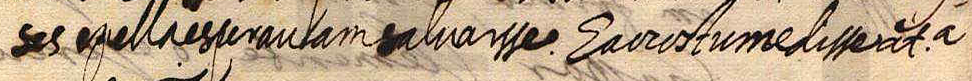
ses e nella esperauam saluarsse. E ao costume disse a t.a
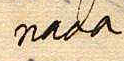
nada
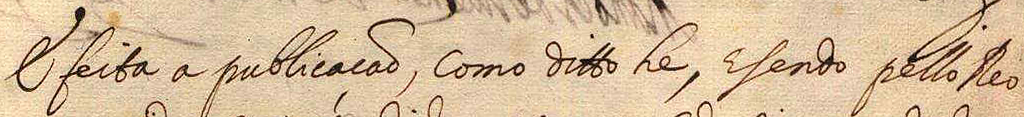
E feita a publicação, como ditto he, E sendo pello Reo
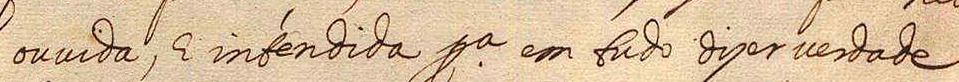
ouuida, E intendida ꝑa. em tudo dizer uerdade
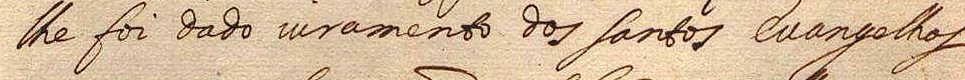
lhe foi dado iuramento dos santos euangelhos
